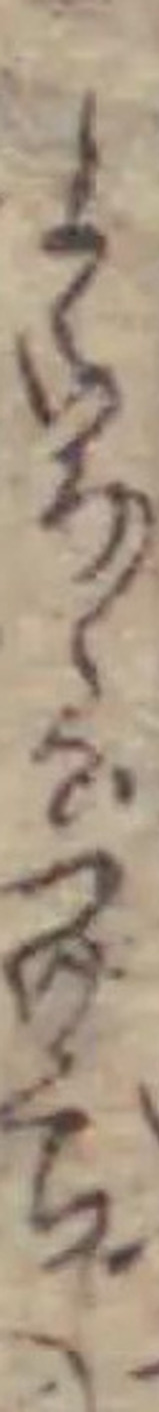よくいろ〳〵なつげくち
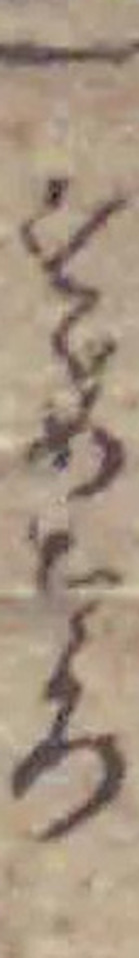すゞめちよろ
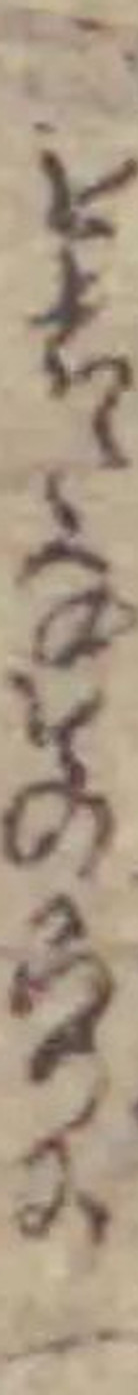をしたるそのかはりに
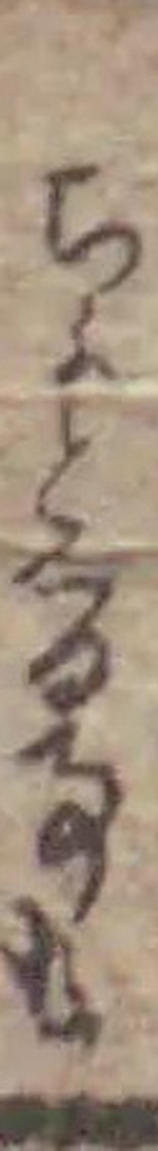ちよとくる事も
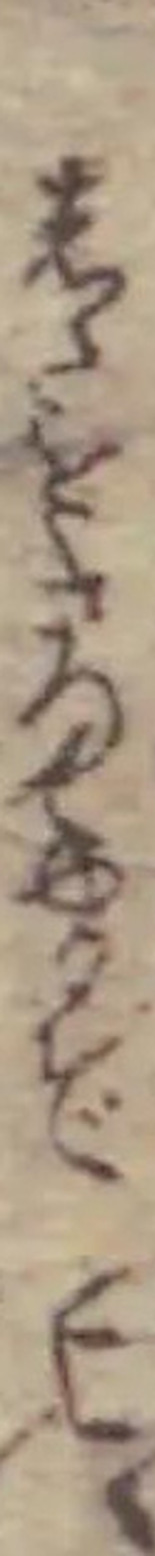したをきつてやるぞ
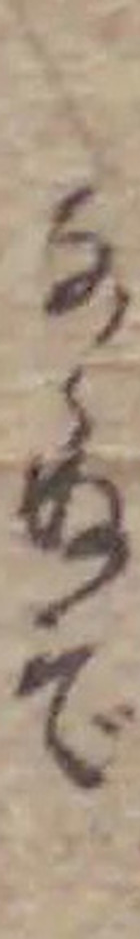ならぬで
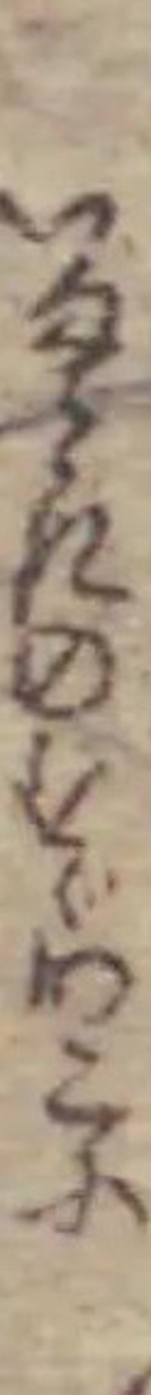いまときのすゞめこに
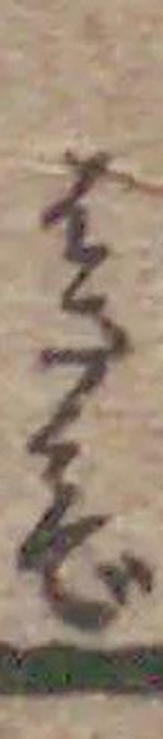はさみで
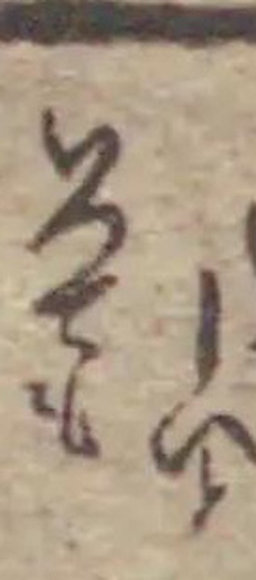いつても
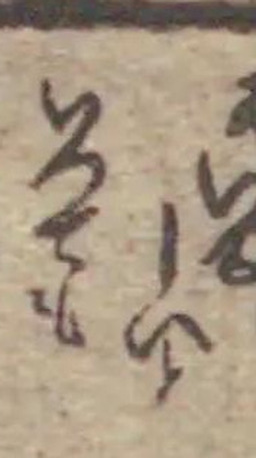いつても
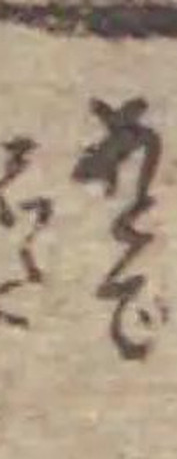あとで
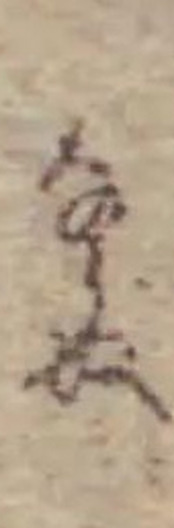ならぬ

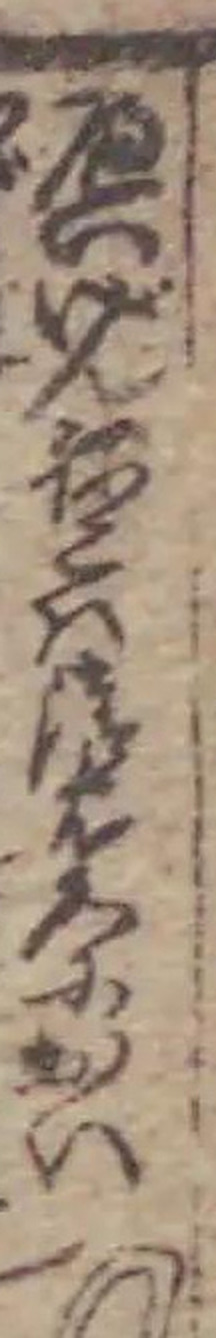へいげんねこは清右エ門におい
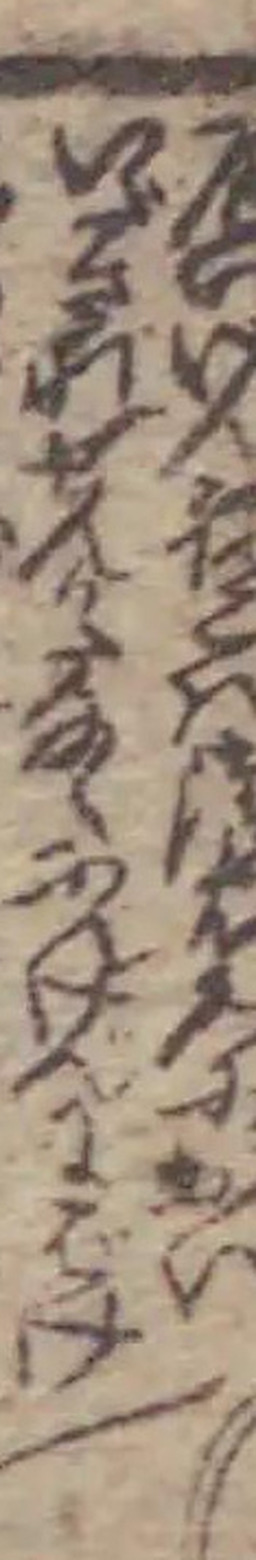いだされせんかたなくにんげんにばけ
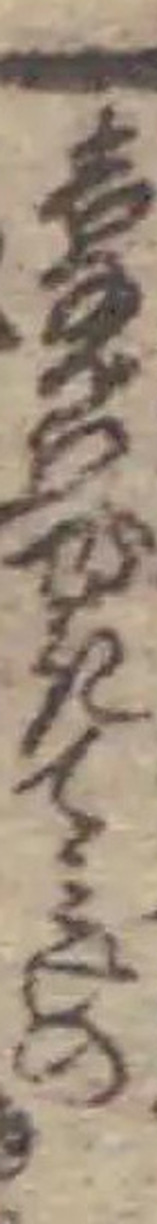しながはへゆきてみけの
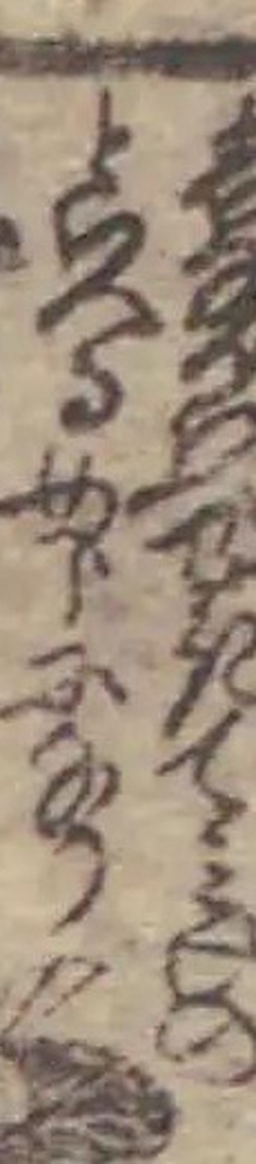といへる女郎になり
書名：冷水灰毛猫 2巻
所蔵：国立国会図書館 National Diet Library, JAPAN
